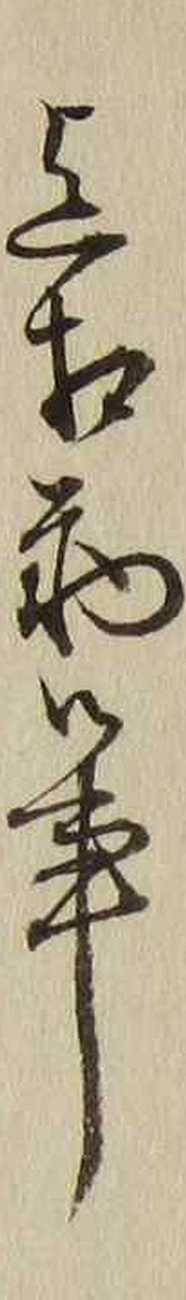迄相勤候事
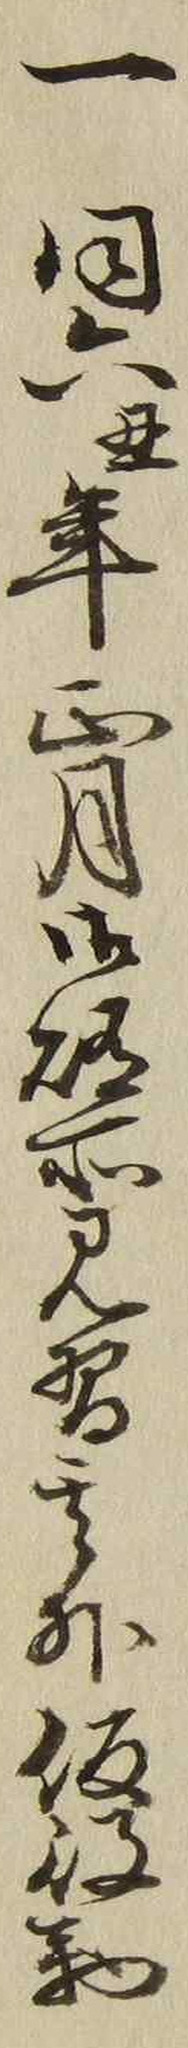一同六丑年正月御賄所見習其外仮役勤

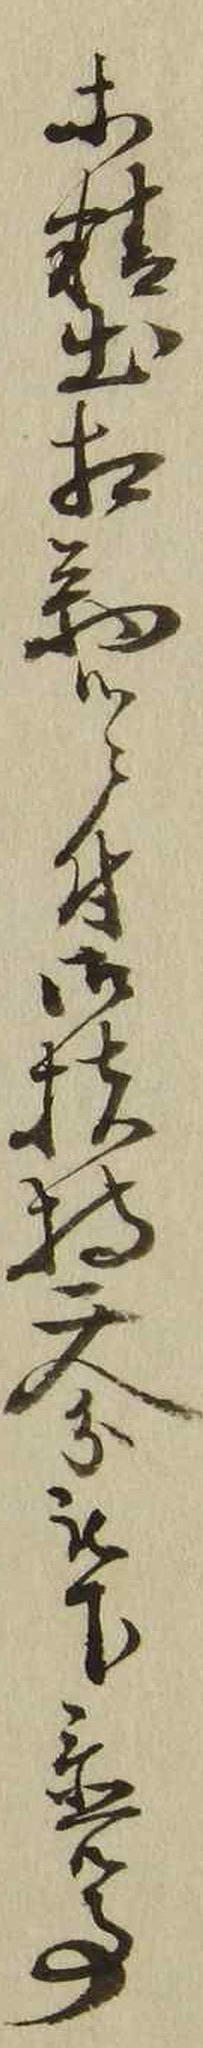等精出相勤候ニ付御扶持二人分被下置候事
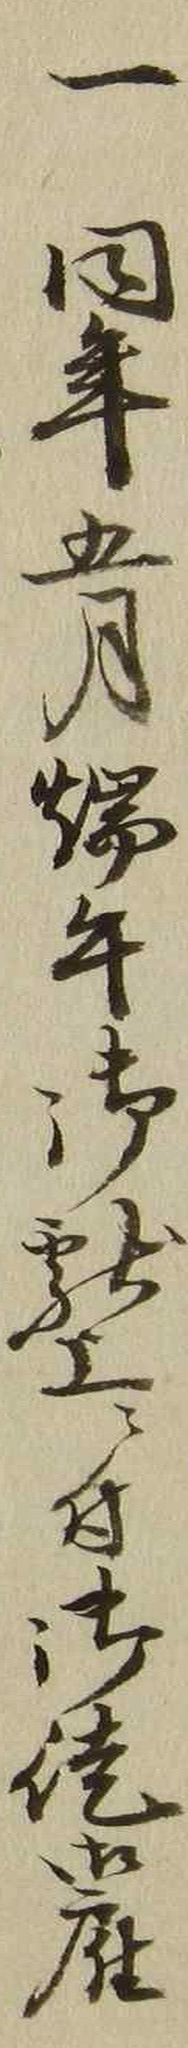一同年五月端午御献上ニ付御徒御雇
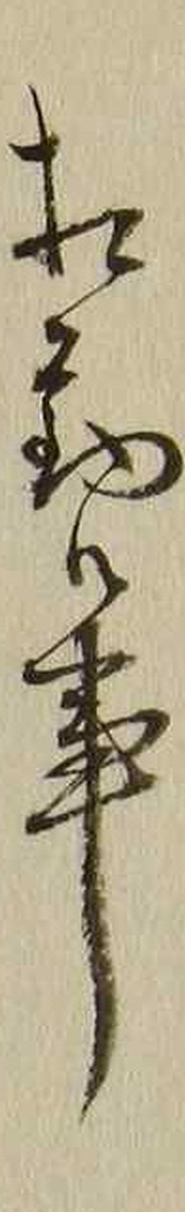相勤候事
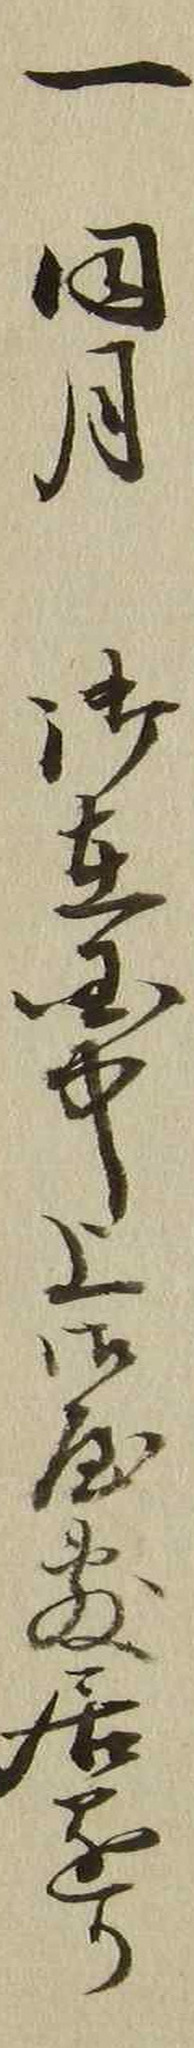一同月御在国中上屋敷居をり
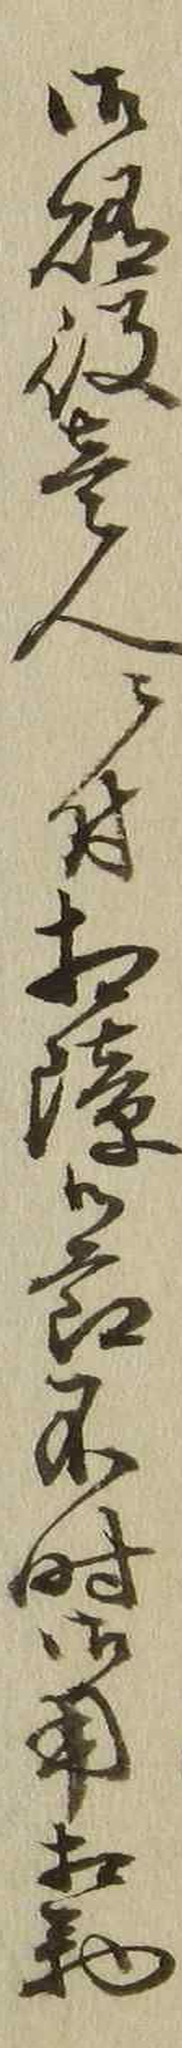御賄役壱人ニ付相障候節不時御用相勤
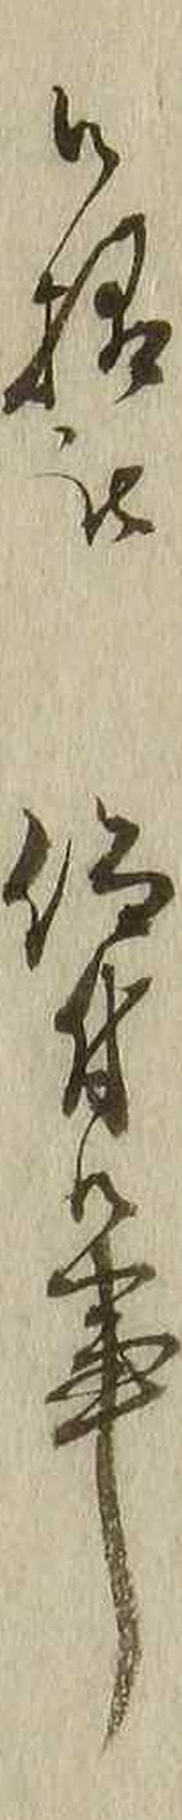候様被仰付候事
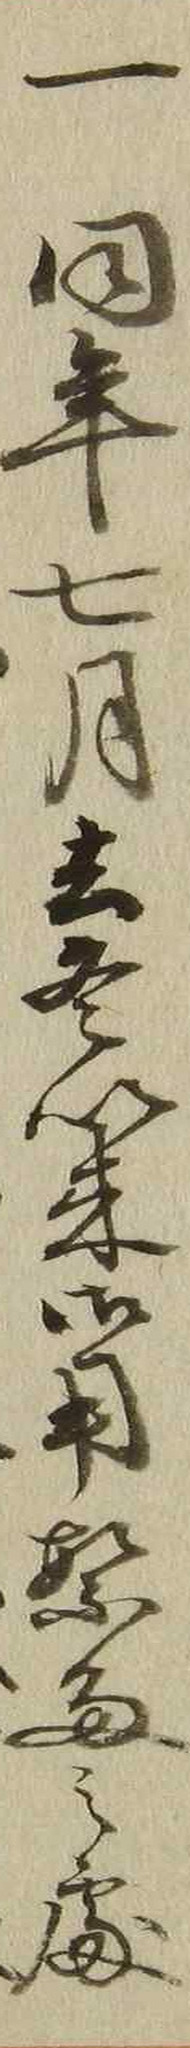一同年七月去冬以来御用繫多之處
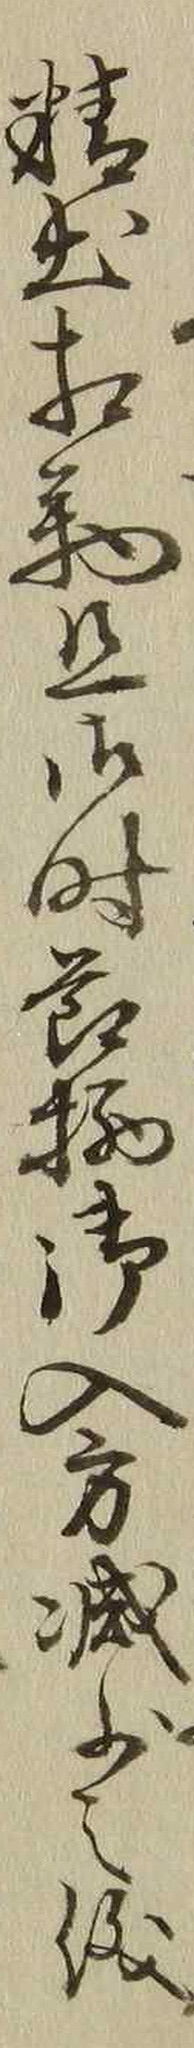精出相勤且御時節柄御入方減少之儀
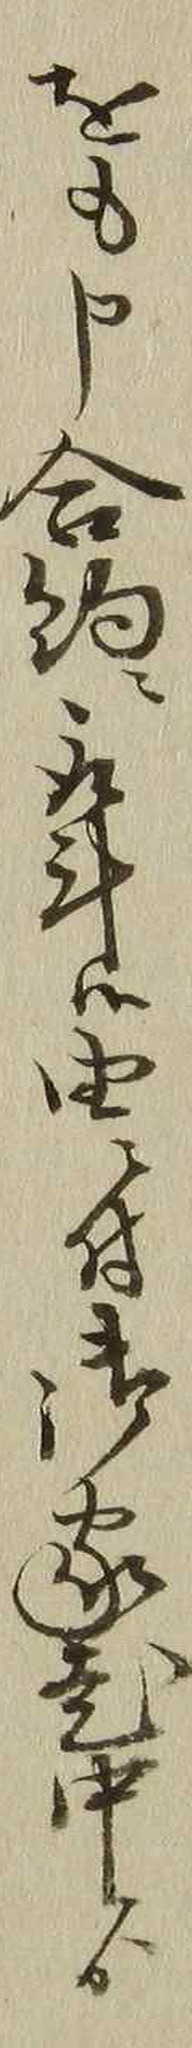をも申合約ニ取斗候由ニ付御家老中ゟ
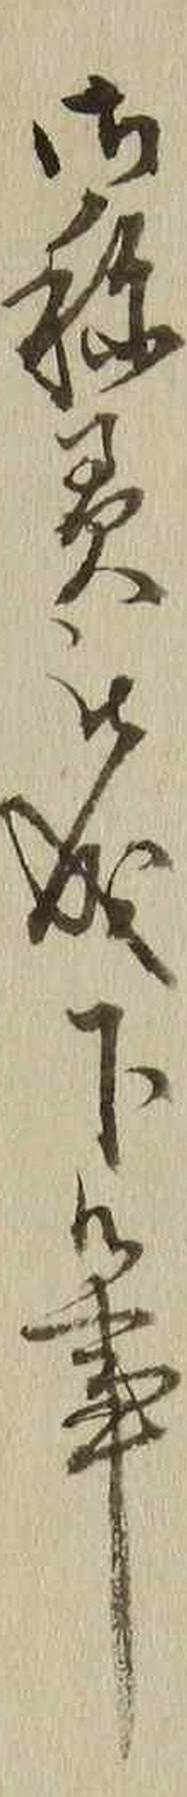御称美被成下候事
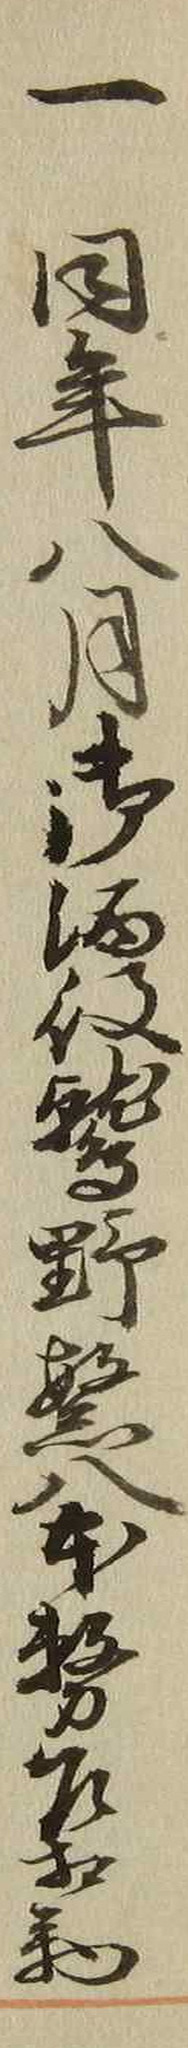一同年八月御酒役鷲野繫八本務乍相勤
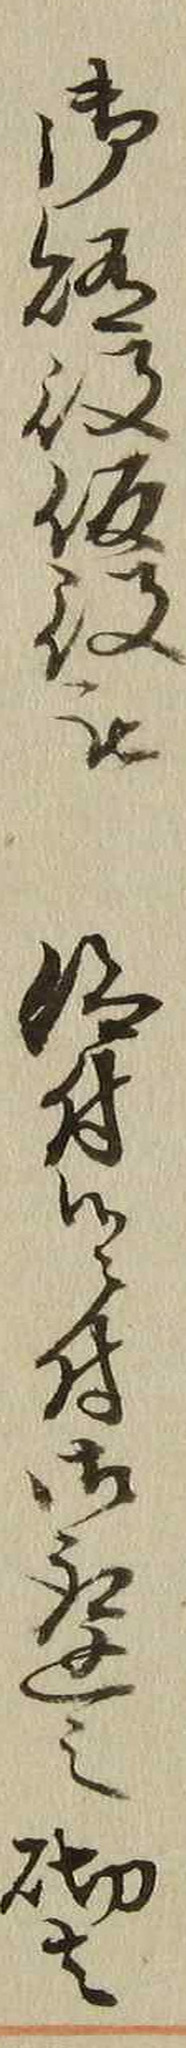御賄役仮役被仰付候ニ付御取込之砌者
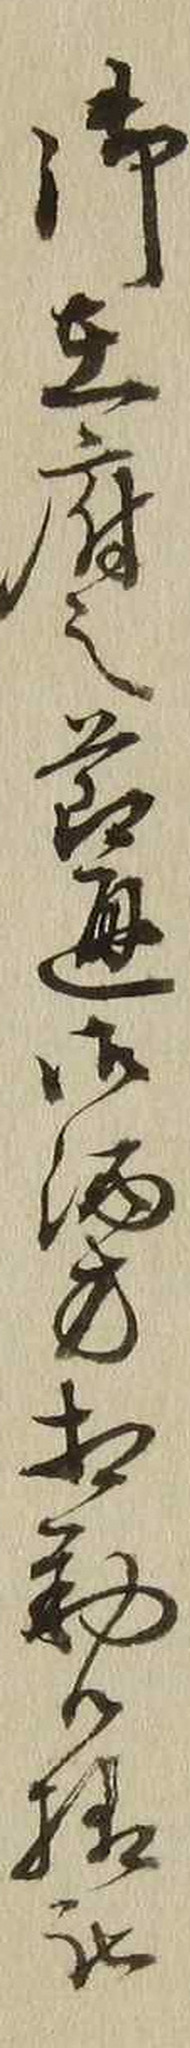御在府之節通御酒方相勤候様被
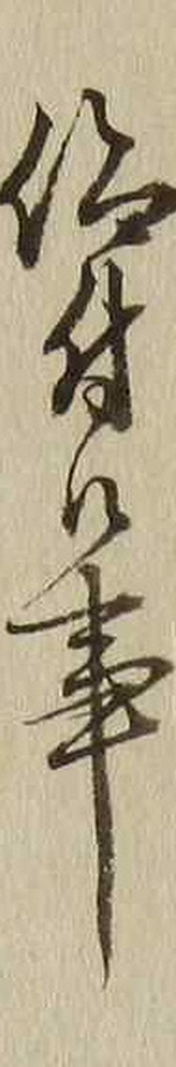仰付候事
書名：諸士系譜　巻之64　と之部7
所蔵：会津若松市立会津図書館
